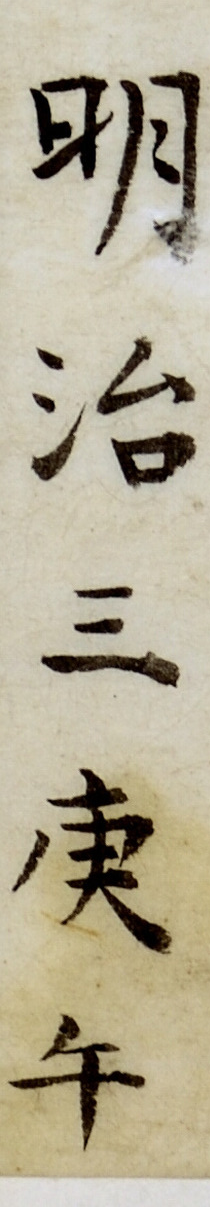明治三庚午
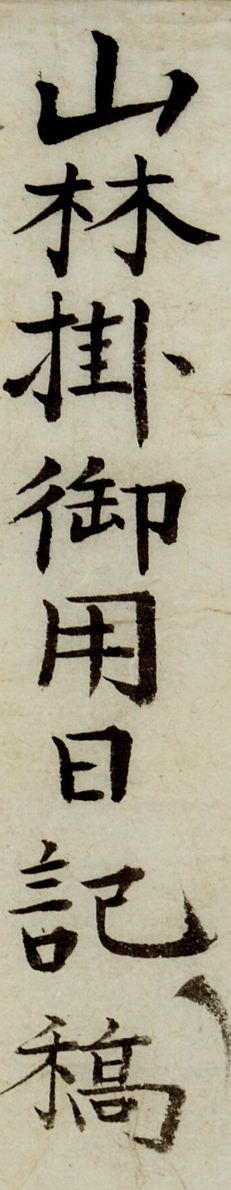山林掛御用日記稿
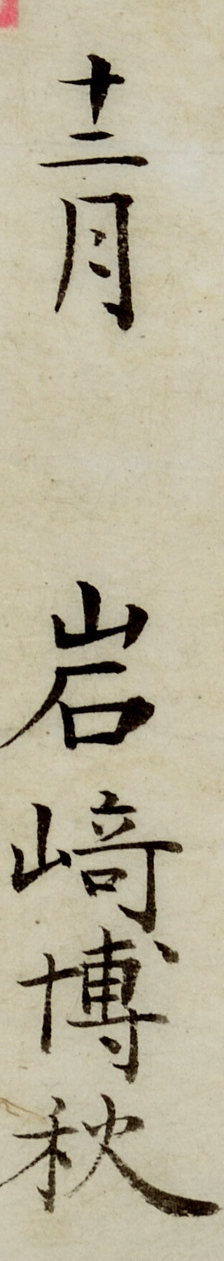十二月岩崎博秋

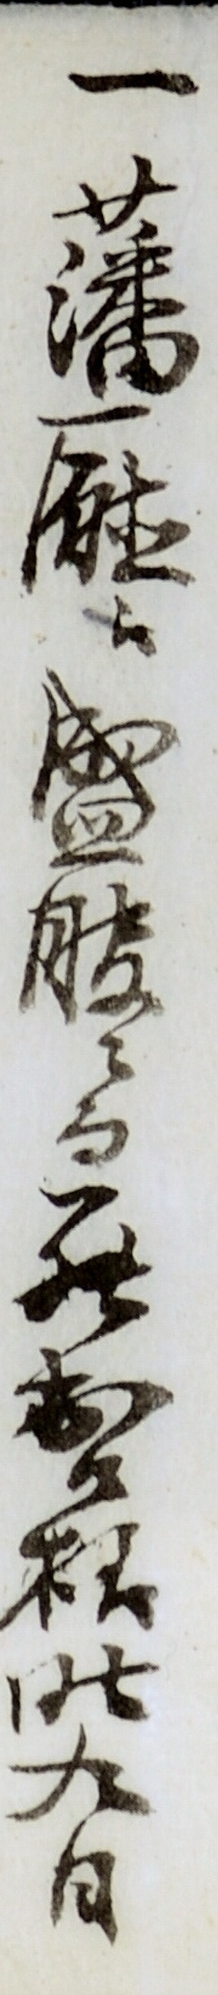一藩庁江盛服ニ而罷出候様昨九日
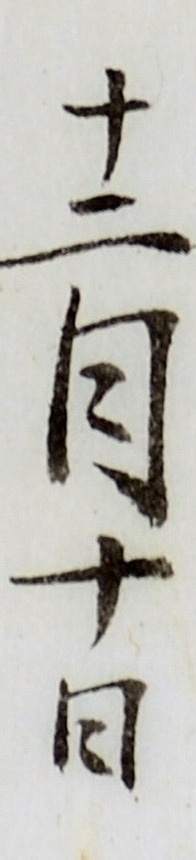十二月十日
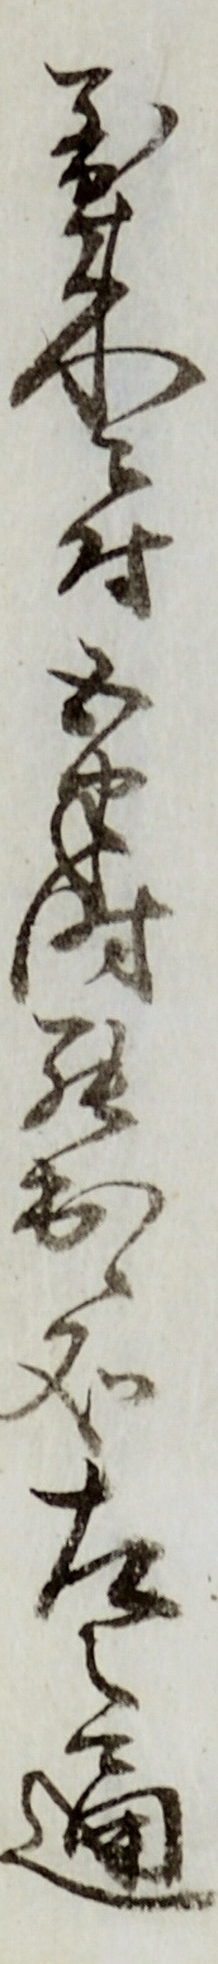到来ニ付五半時罷出候処左之通
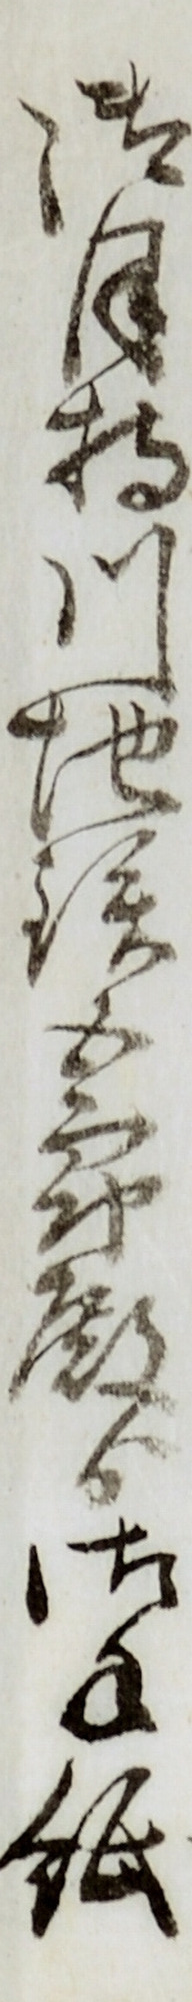御月持川地鉄五郎殿ゟ御手紙
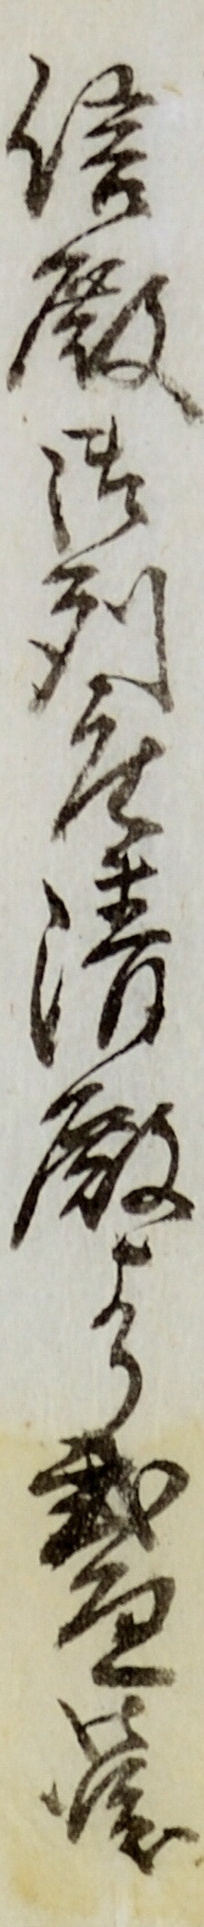信殿御列座清殿より弐通被渡
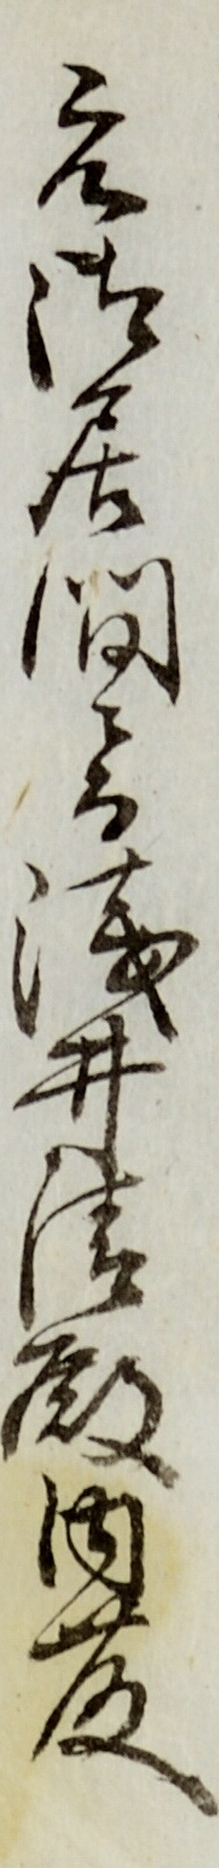元御居間ニ而浅井清殿内藤
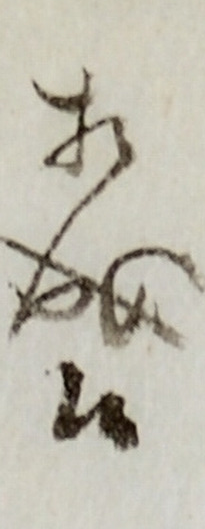相成候
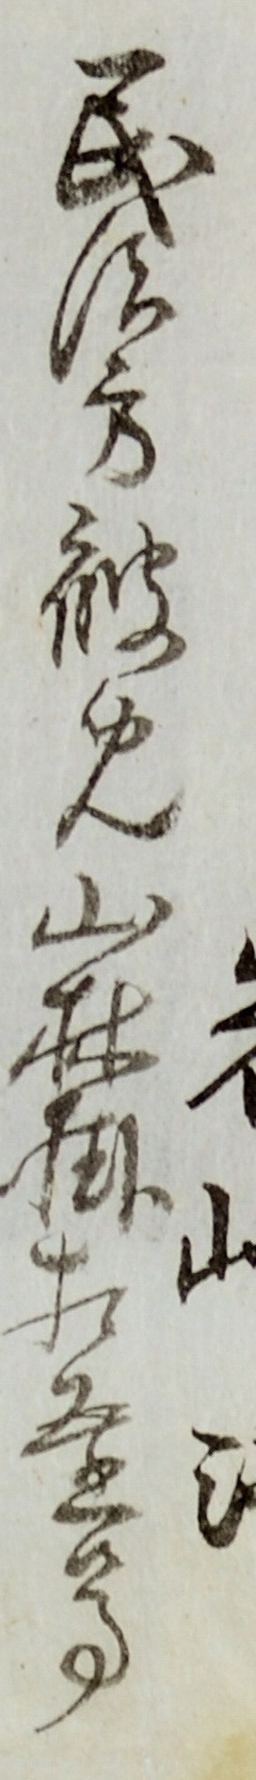民治方被免山林掛相達候事

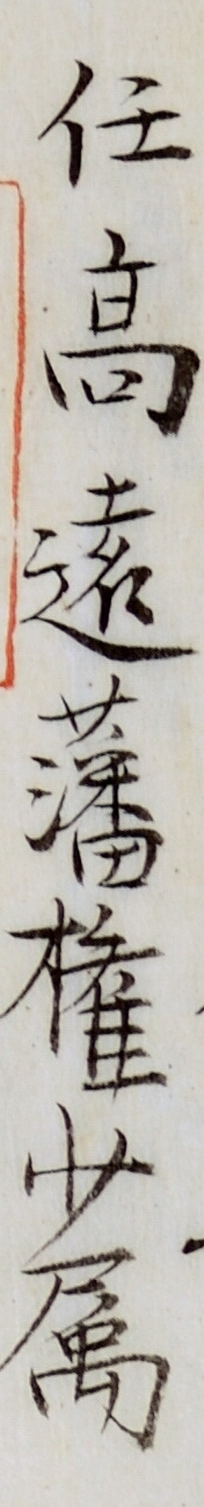任高遠藩権少属
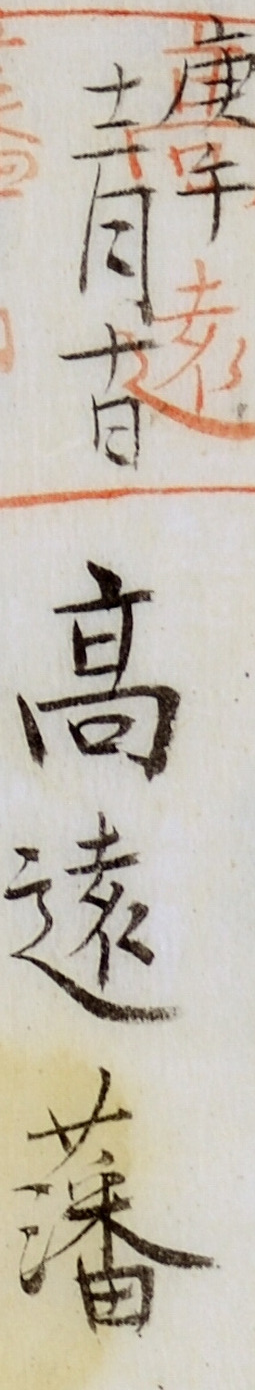十二月十日高遠藩
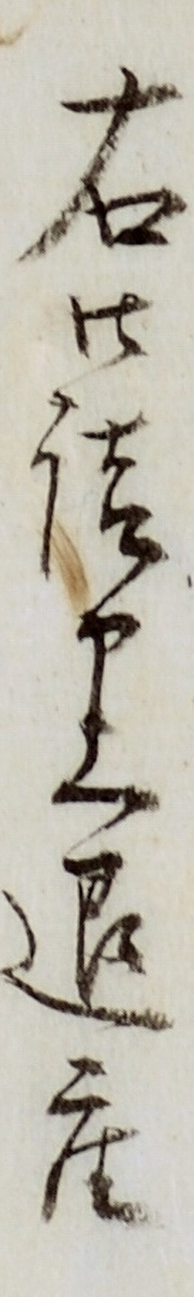右御請申上退座
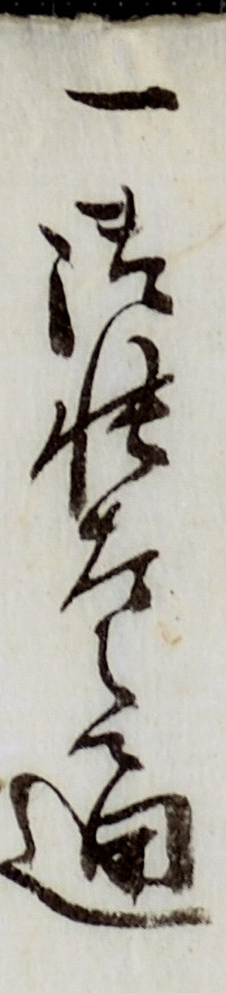一御帳左之通
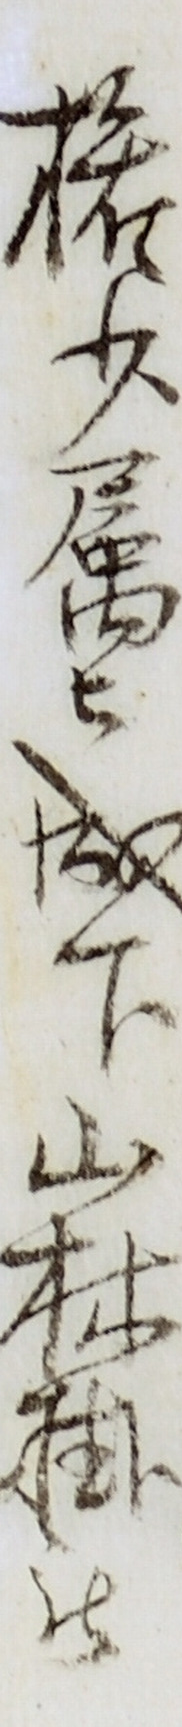権少属被成下山林掛被
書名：山林掛御用日記稿
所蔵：伊那市立高遠町図書館・合同会社AMANE
